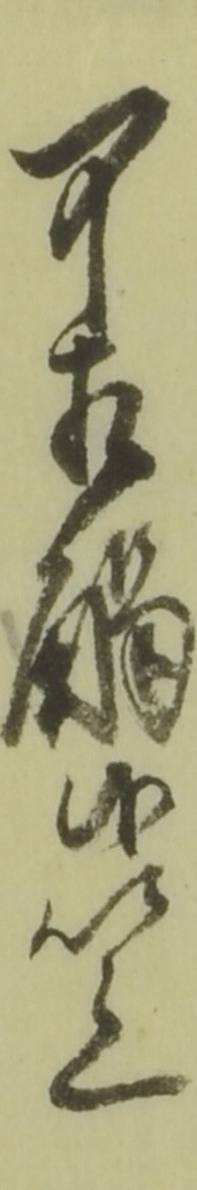可相触候以上
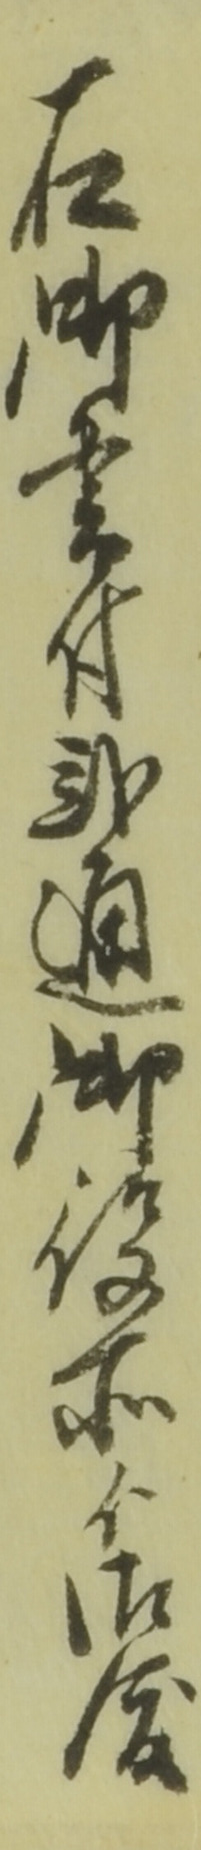右御書付弐通御役所ゟ御渡
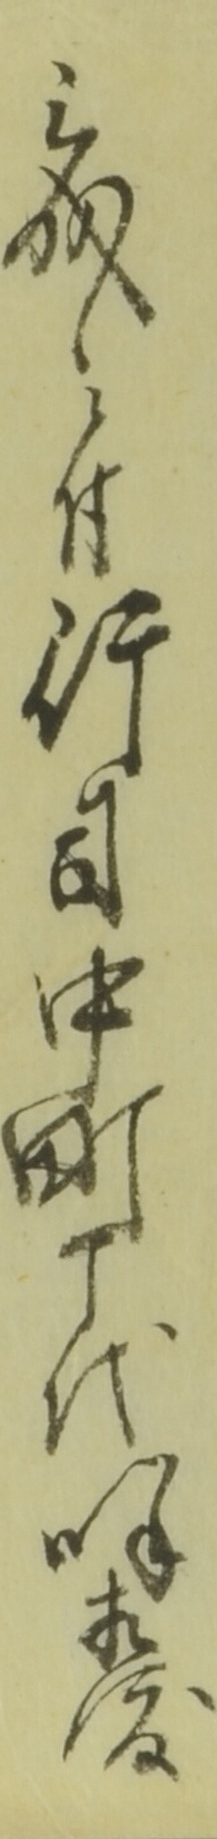被成候ニ付行司中町丁代呼相渡

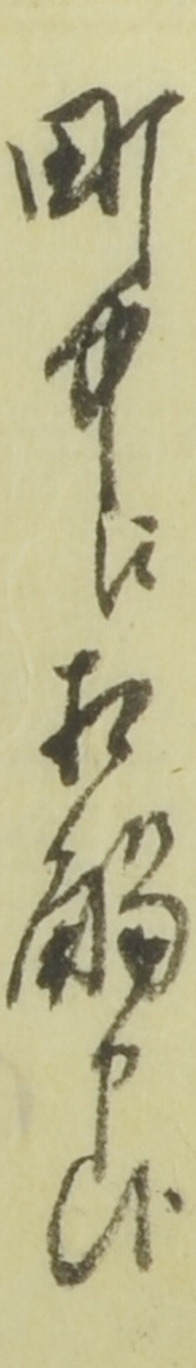町中江相触申候
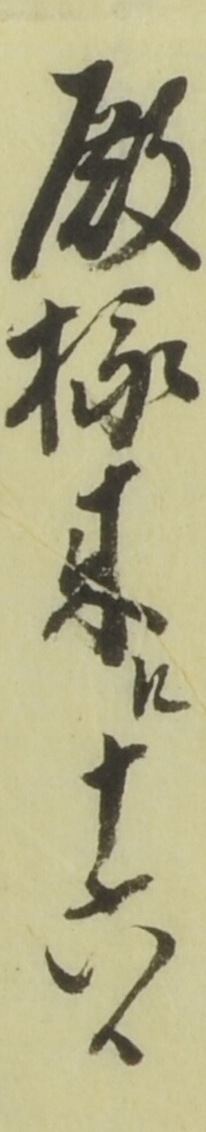殿様来ル十六日
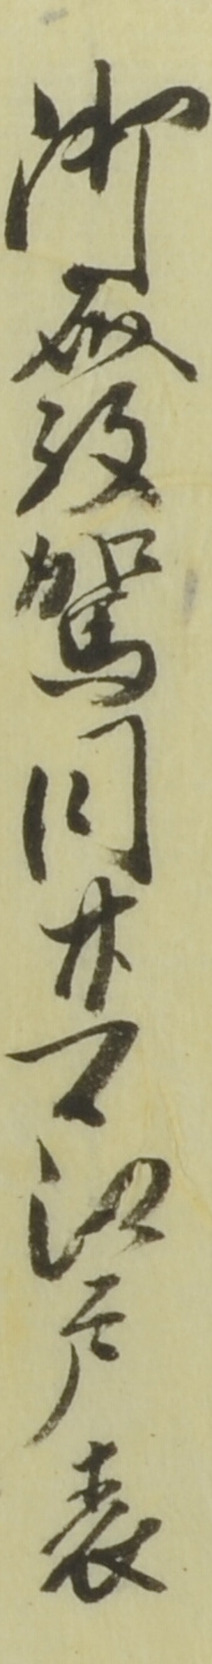御発駕同廿一日江戸表
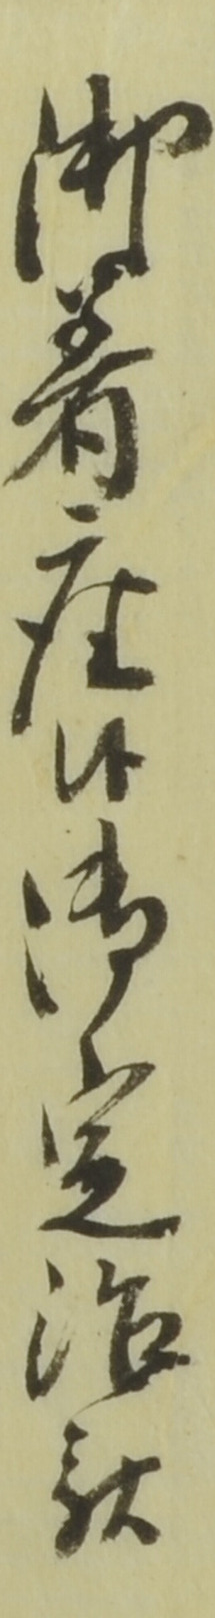御着座候御定治被
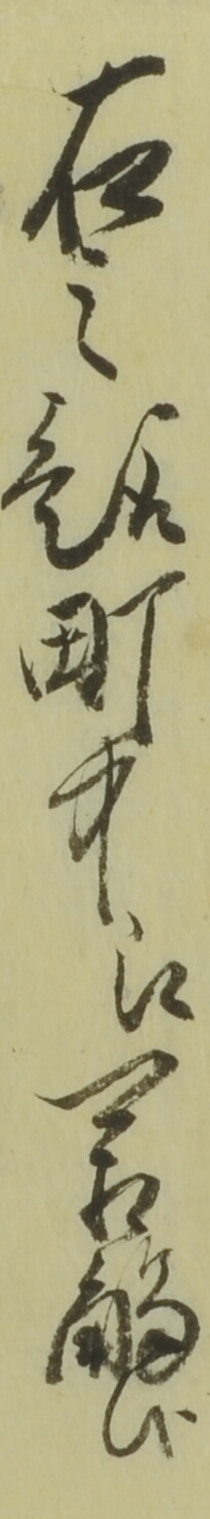右之趣町中江可相触候
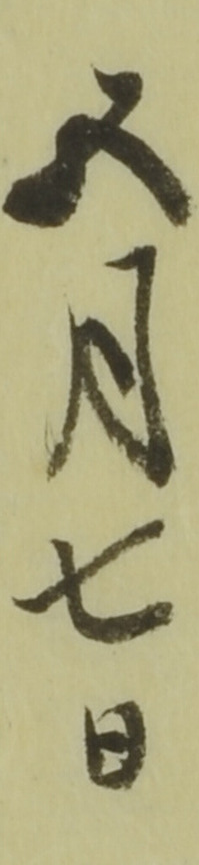五月七日
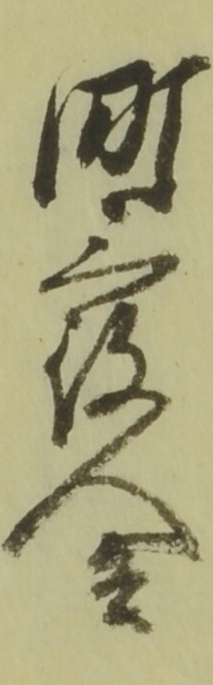町三役人共
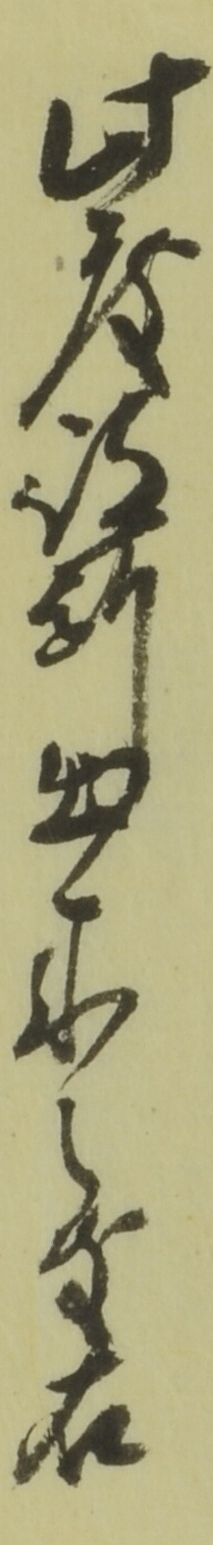此度役所出来之処右
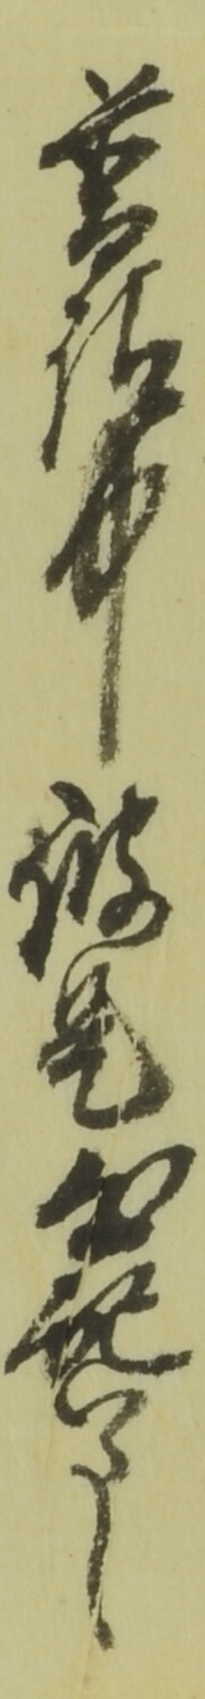普請中彼是心配いたし
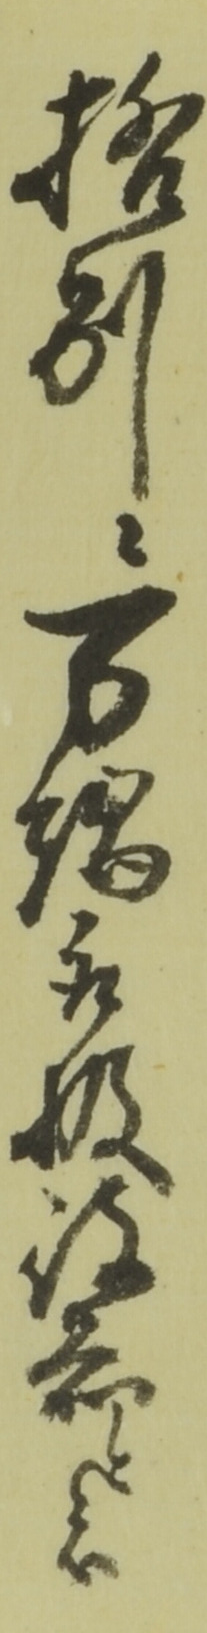格別ニ万端取扱役所とは
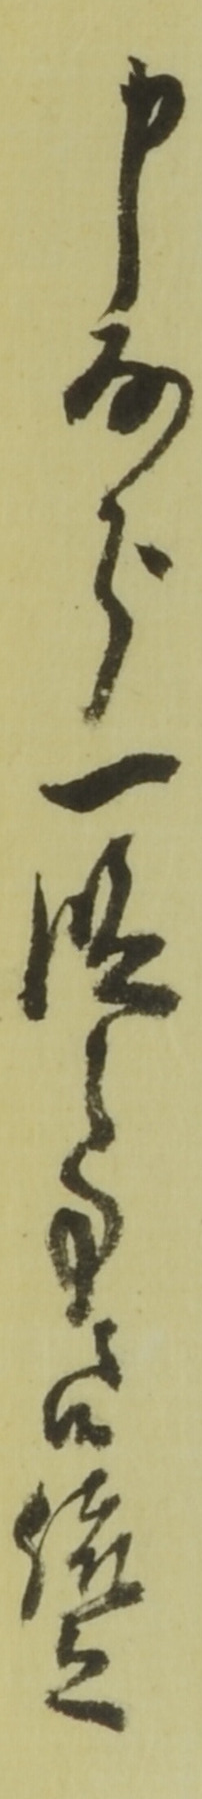申なら一段之事ニ候依之
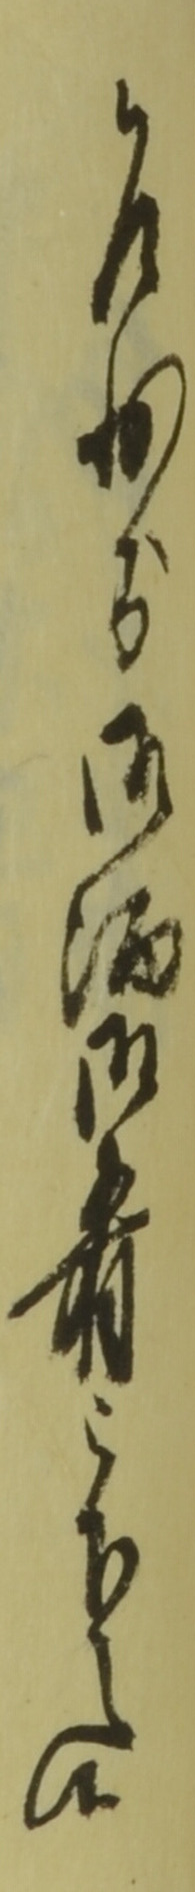乍少分御酒御肴被下之候
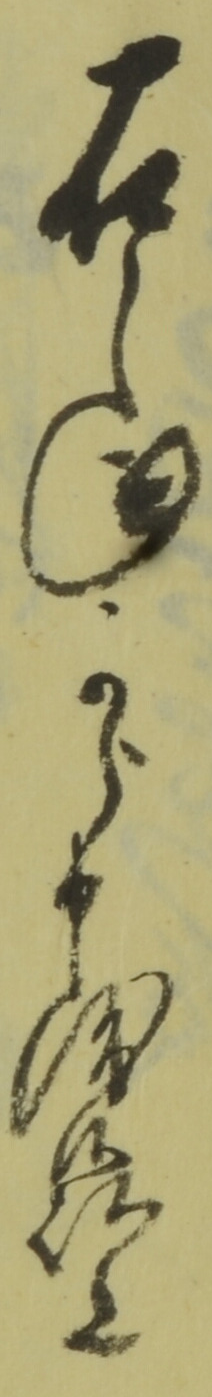右之趣可被申渡候以上
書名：御触書御書附控
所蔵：伊那市立高遠町図書館・合同会社AMANE
